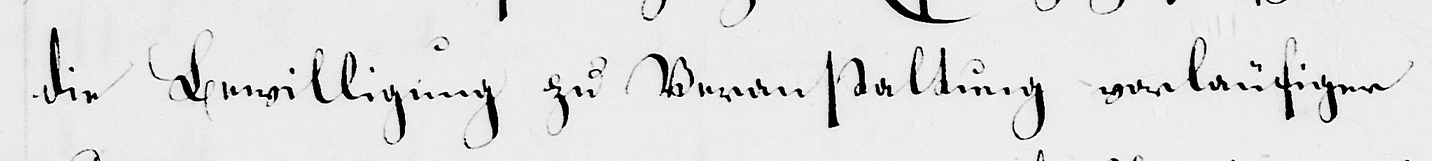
die Bewilligung zu Veranstaltung vorläufiger
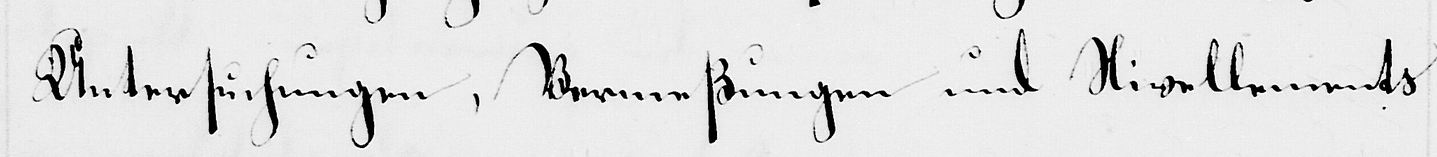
Untersuchungen, Vermeßungen und Nivellements
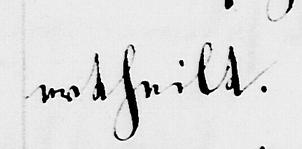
ertheilt.
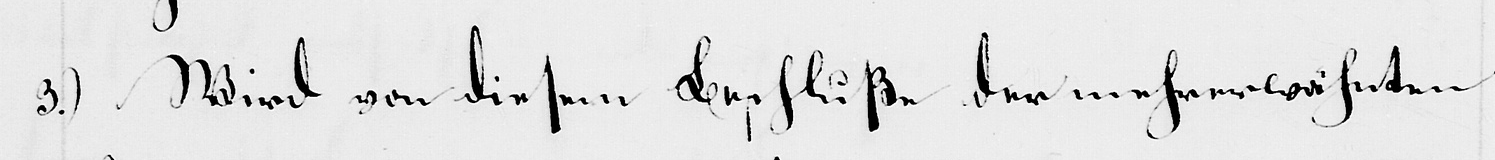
3.) Wird von diesem Beschluße der mehrerwähnten
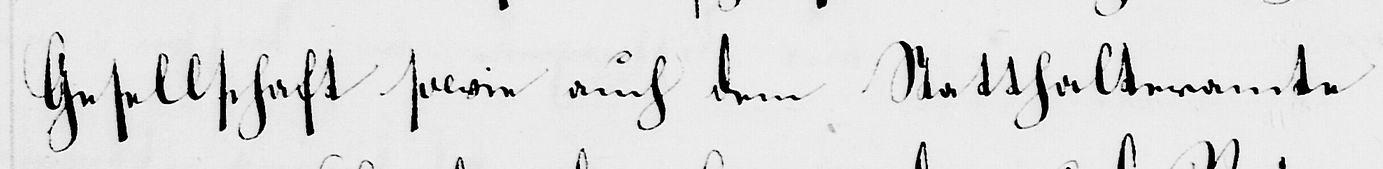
Gesellschaft sowie auch dem Statthalteramte
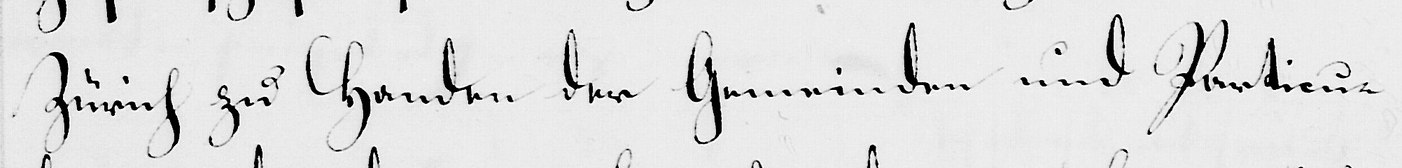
Zürich zu Handen der Gemeinden und Particu¬
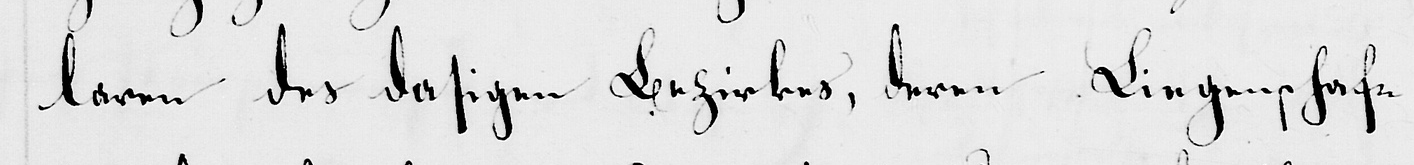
laren des dasigen Bezirkes, deren Liegenschaf¬
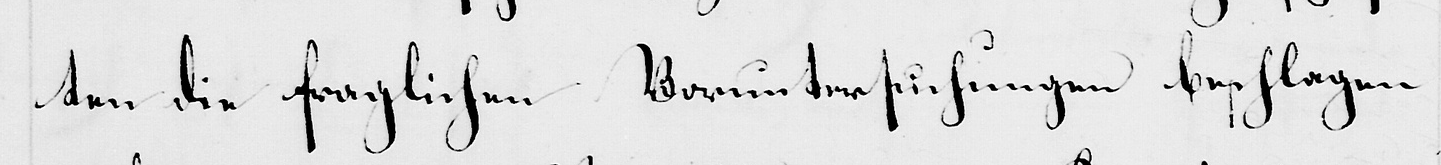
ten die fraglichen Voruntersuchungen beschlagen
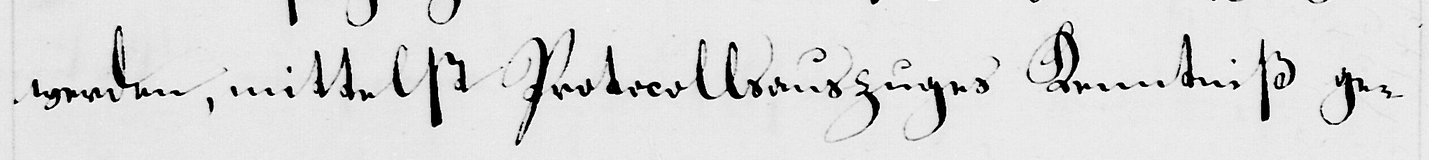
werden, mittelst Protocollsauszuges Kenntniß ge¬
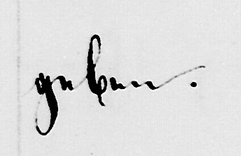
geben.
